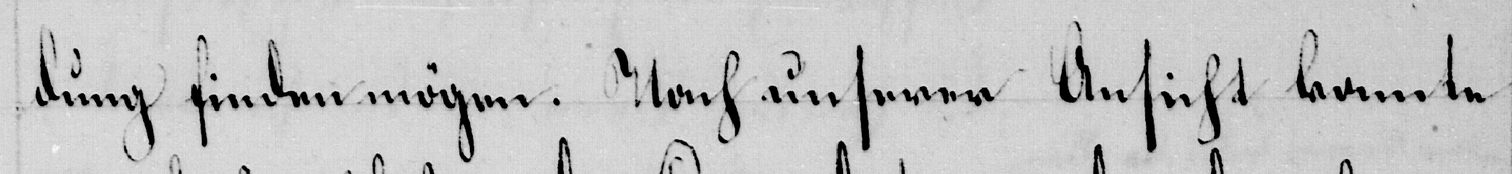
dung finden mögen. Nach unserer Ansicht konnte
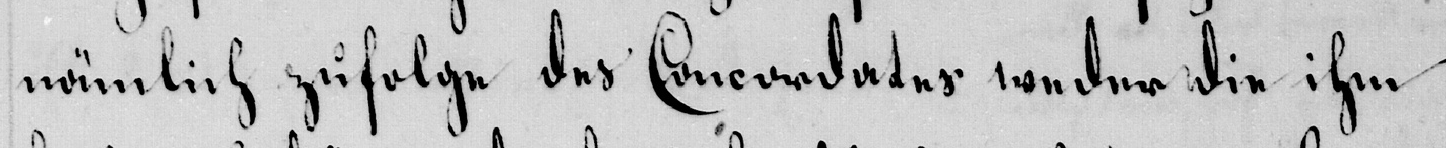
nämlich zufolge des Concordates weder die ihm
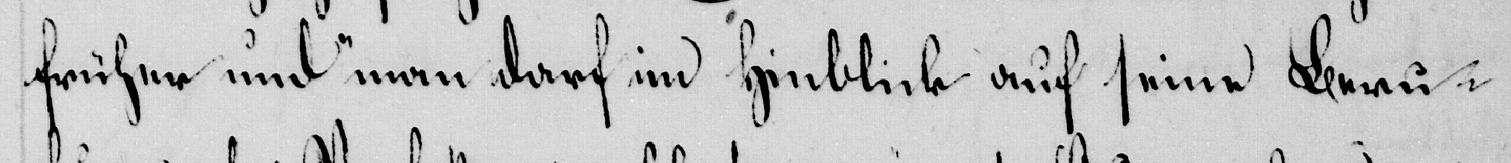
früher und man darf im Hinblick auf seine Beru¬
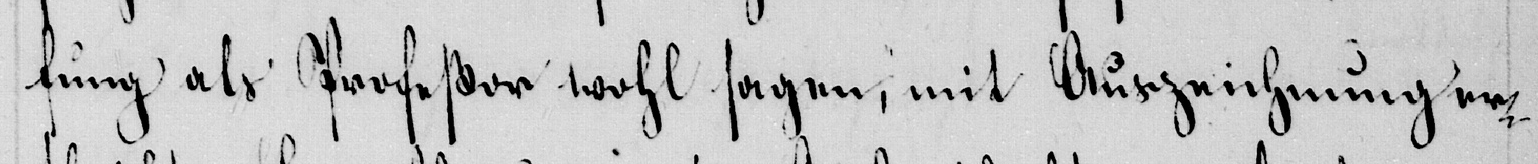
fung als Profeßor wohl sagen, mit Auszeichnung er¬
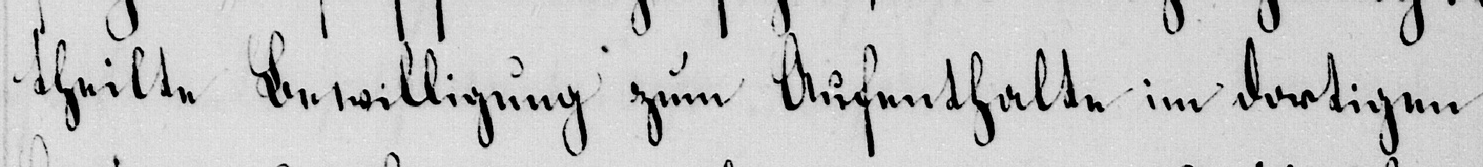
theilte Bewilligung zum Aufenthalte im dortigen
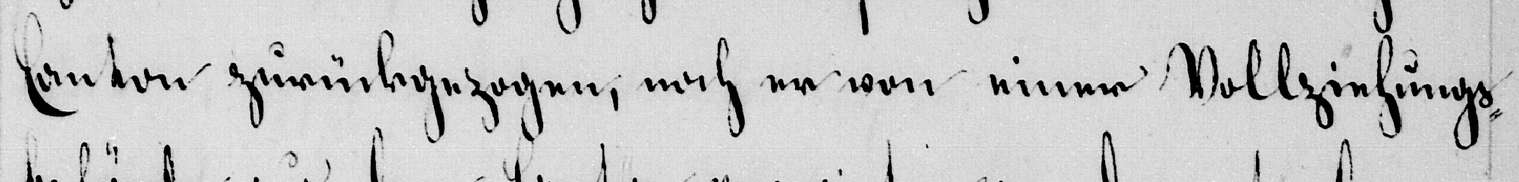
Canton zurückgezogen, noch er von einer Vollziehungs¬
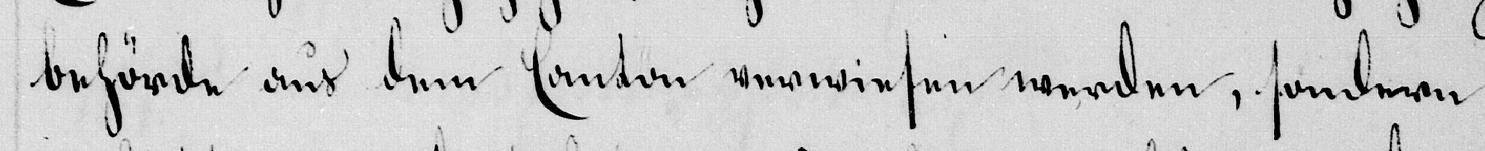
behörde aus dem Canton verwiesen werden, sondern
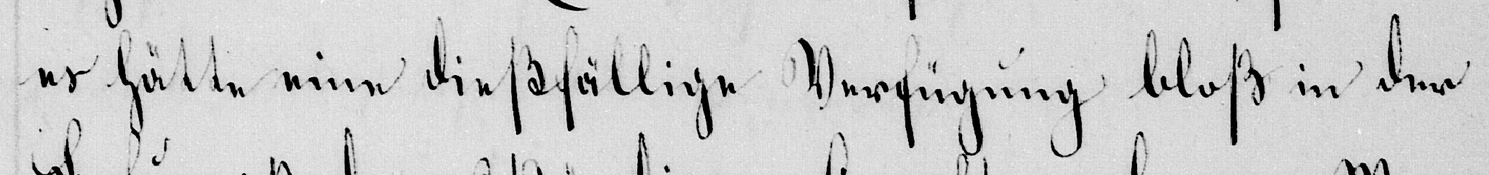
er hätte eine dießfällige Verfügung bloß in der
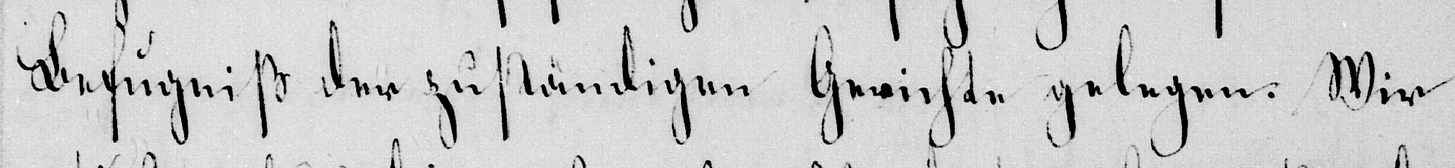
Befugniß der zuständigen Gerichte gelegen. Wir
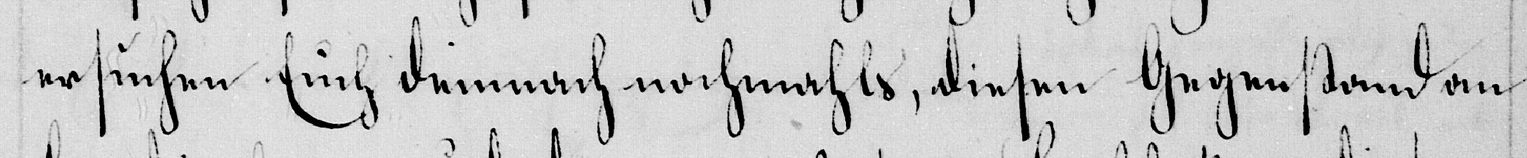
ersuchen Euch demnach nochmahls, diesen Gegenstand an
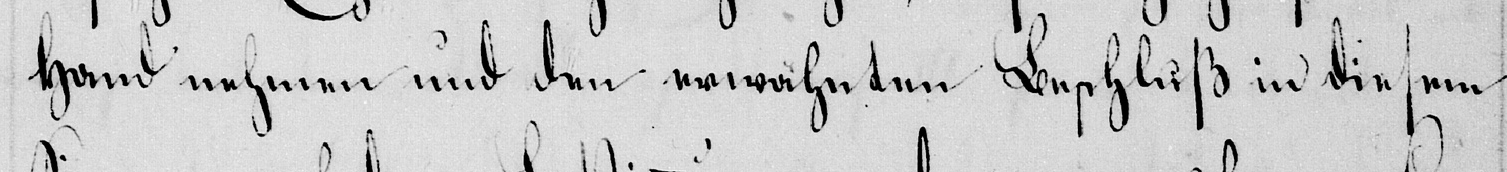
Hand nehmen und den erwähnten Beschluß in diesem
